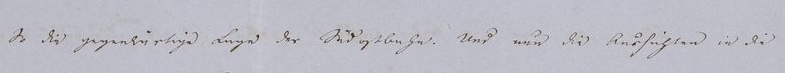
So die gegenwärtige Lage der Südostbahn. Und nun die Aussichten in die
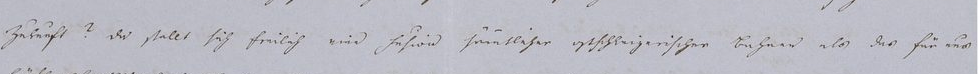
Zukunft? Da stellt sich freilich eine Fusion sämmtlicher ostschweizerischen Bahnen als das für uns
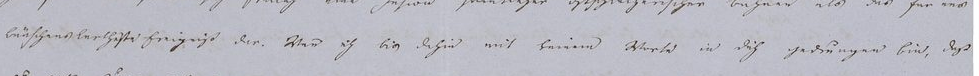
wünschenswertheste Ereigniß dar. Wenn ich bis dahin mit keinem Worte in Dich gedrungen bin, daß
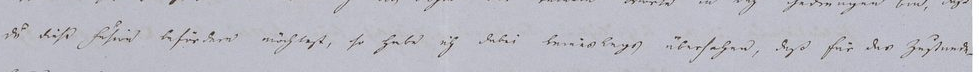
Du diese Fusion befördern möchtest, so habe ich dabei keineswegs übersehen, daß für das Zustande-
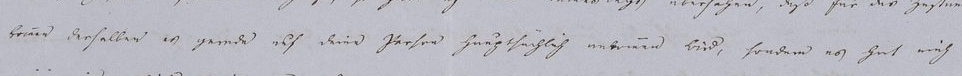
kommen derselben es gerade auf Deine Person hauptsächlich ankommen wird, sondern es hat mich
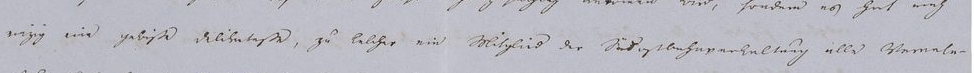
einzig eine gewiße Delikateße, zu welcher ein Mitglied der Südostbahnverwaltung alle Veranla-
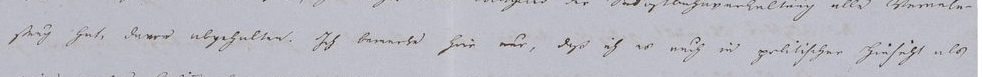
ßung hat, davon abgehalten. Ich bemerke hier nur, daß ich es auch in politischer Hinsicht als
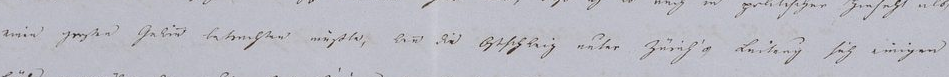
einen großen Gewinn betrachten müßte, wenn die Ostschweiz unter Zürich's Leitung sich einigen
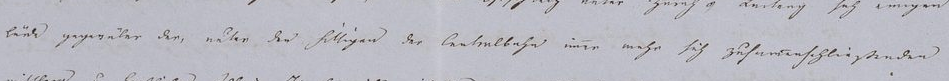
würde gegenüber der, unter den Fittigen der Centralbahn immer mehr sich zusammenschließenden
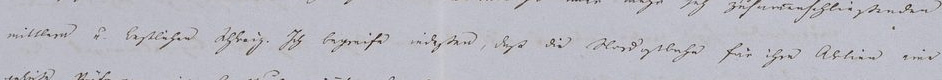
mittlern u. westlichen Schweiz. Ich begreife indeßen, daß die Nordostbahn für ihre Aktien eine
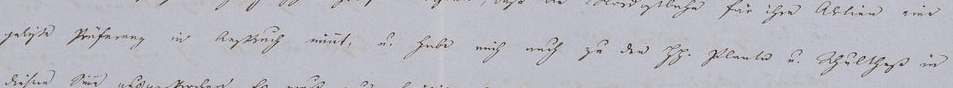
gewiße Präferenz in Anspruch nimmt, u. habe mich auch zu den HH. Planta u. Schultheß in
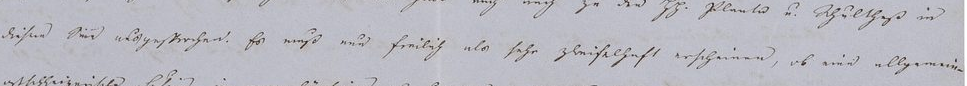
diesem Sinne ausgesprochen. Es muß nun freilich als sehr zweifelhaft erscheinen, ob eine allgemein-
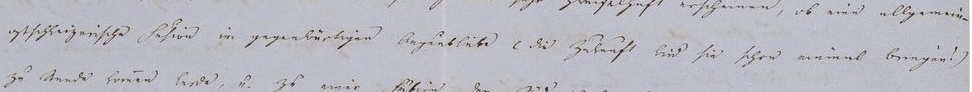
ostschweizerische Fusion im gegenwärtigen Augenblick (die Zukunft wird sie schon einmal bringen!)
